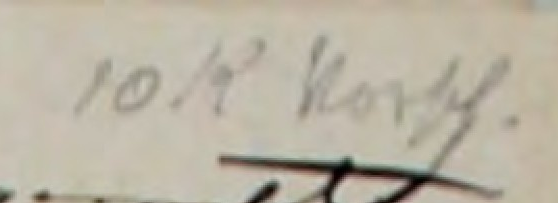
10 K Rosch.
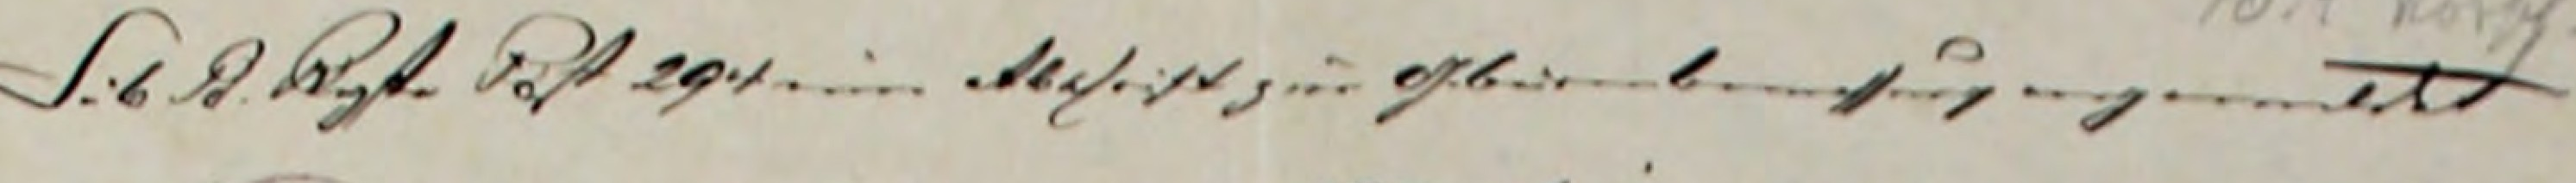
Dis B. Rgte Post 294 nun Abschrift zur Gebürenb???ssung angemerkt
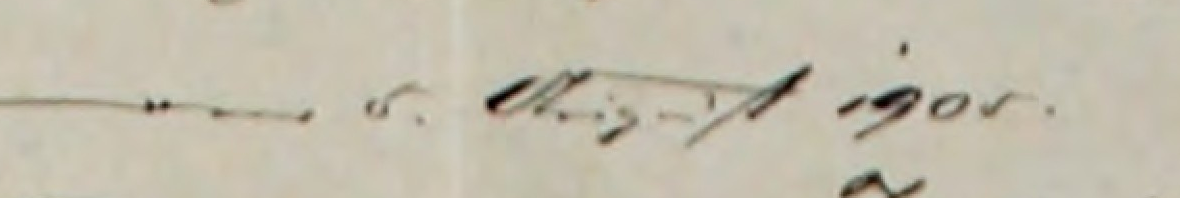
am 5. August 1905.
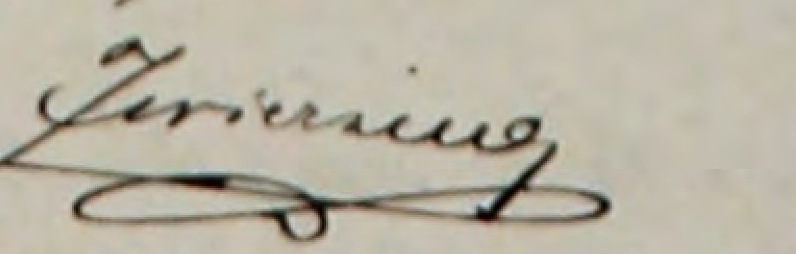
Zerierning
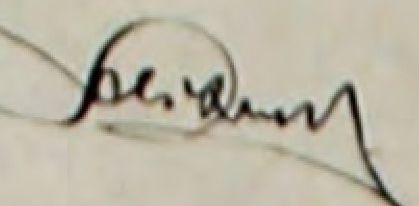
Schrang
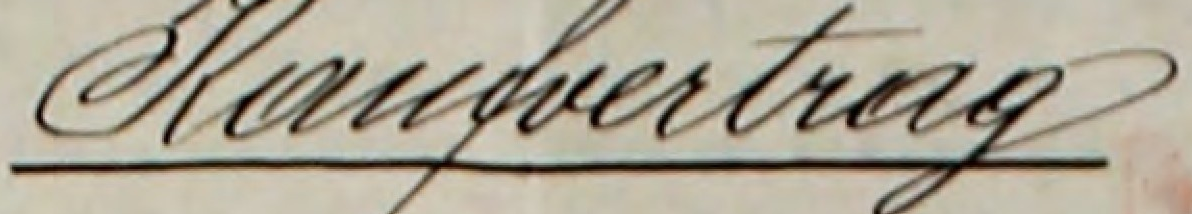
Kaufvertrag
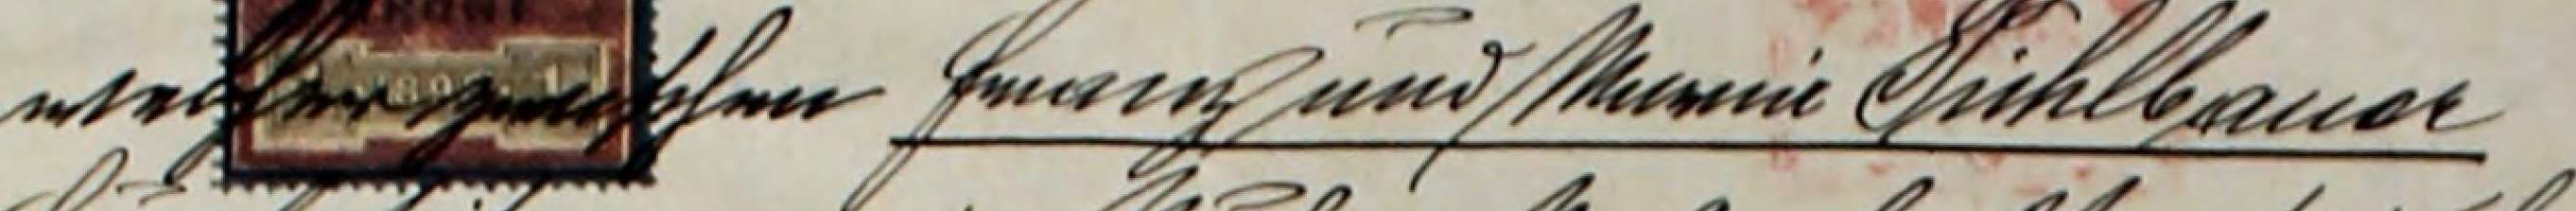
melcherz???schen Franz und Maria Pichlbauer
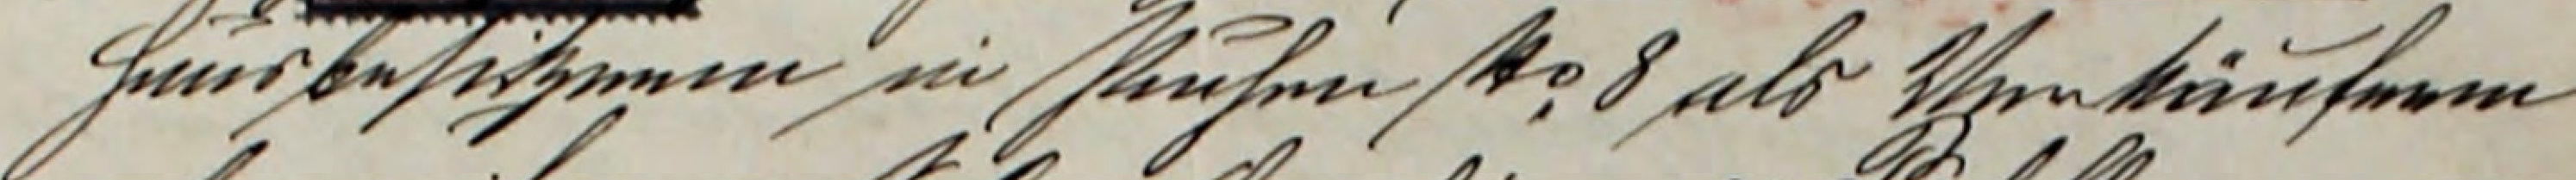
haus besitzenem in Puchen No 8 als Verkäuferm
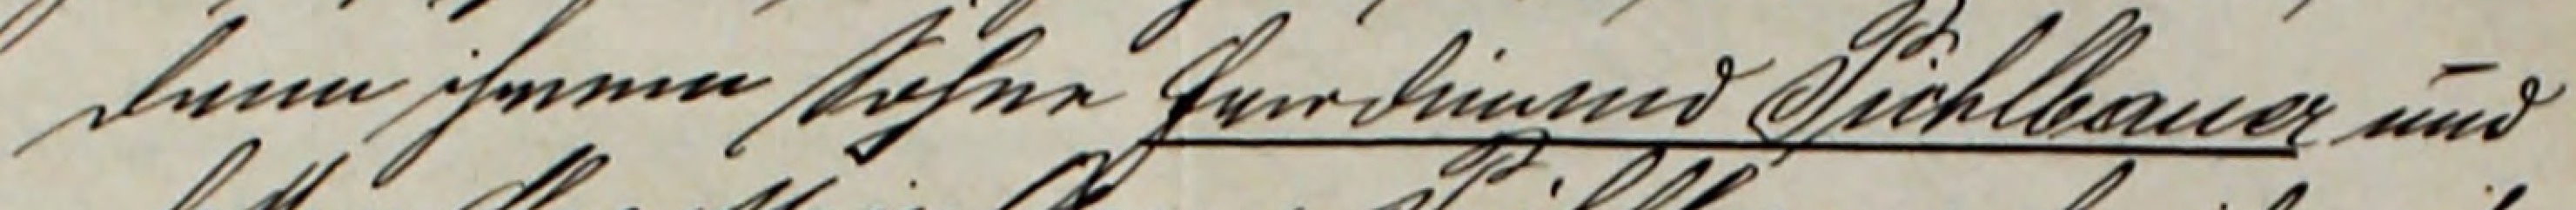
dann ihrem Sohne Ferdinand Pichlbauer und
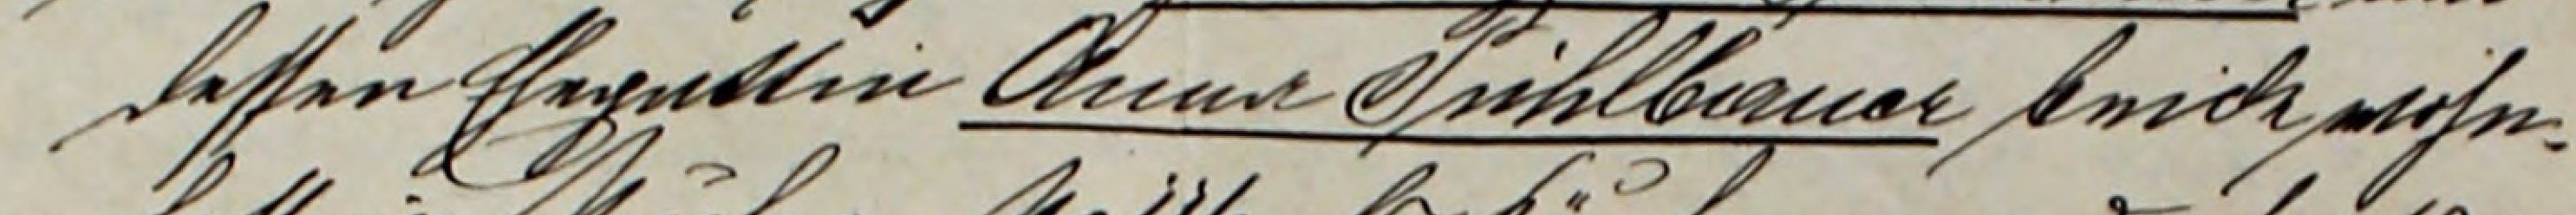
dessen Ehegattin Anna Pichlbauer beide wohn=
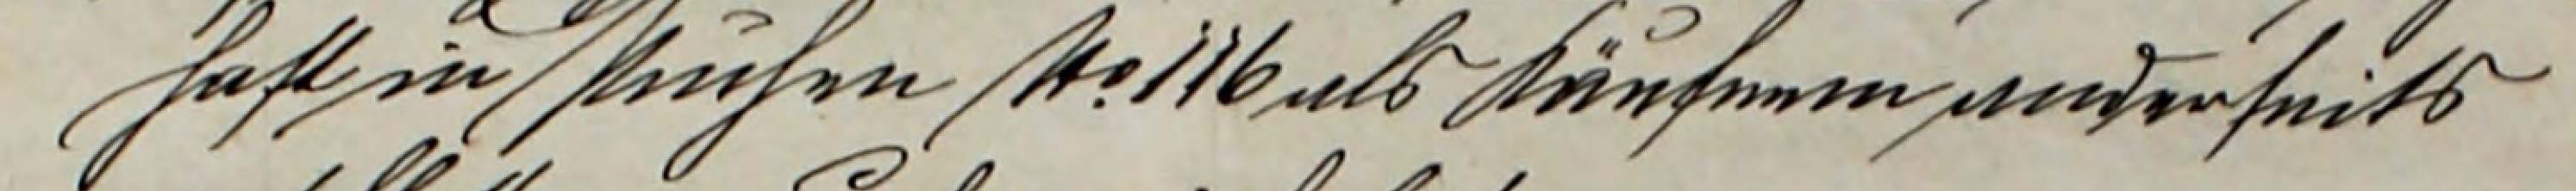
haft in Muhen No 116 als Käufnem anderseits
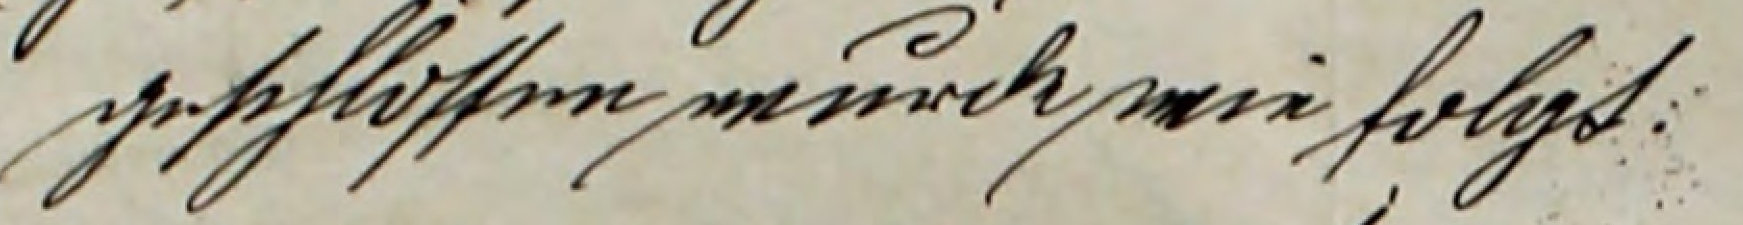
geschlossen vurck wie folgt.
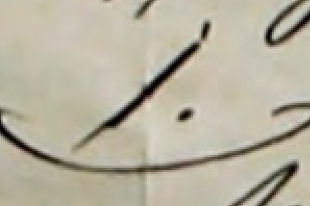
1.
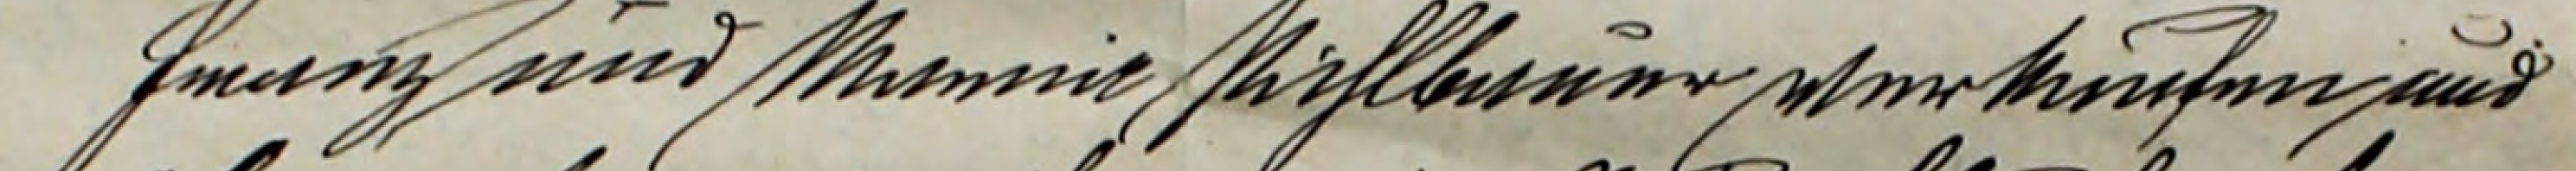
Franz und Maria Pichlbauer verkunfen und
